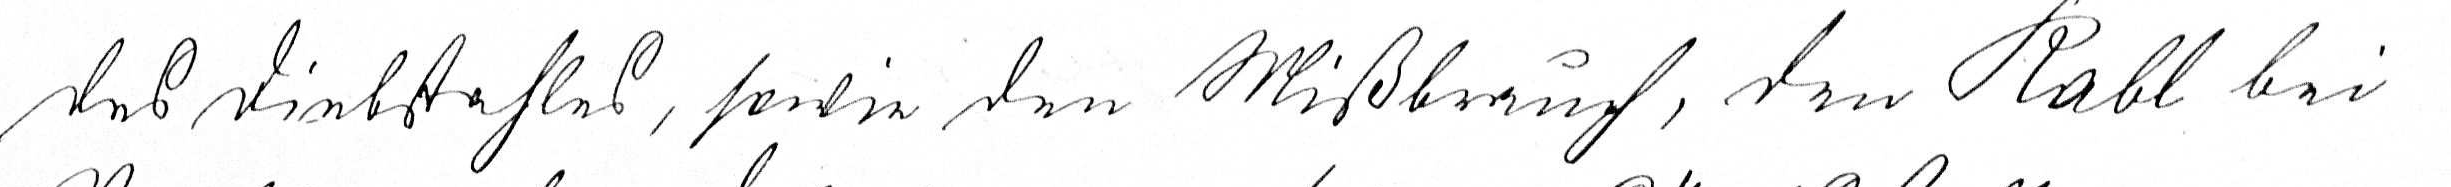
des Diebstahles, sowie den Mißbrauch, den Rabl bei
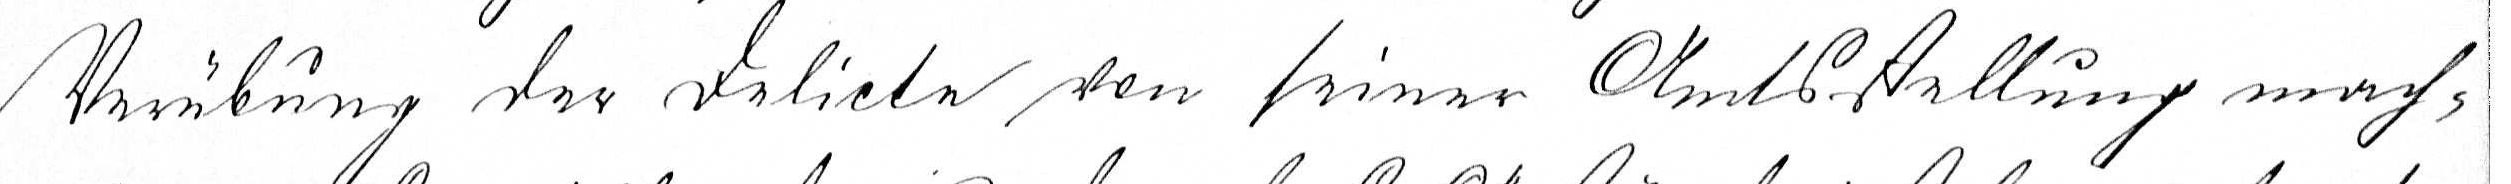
Verübung der Delicte von seiner Amtsstellung mach¬
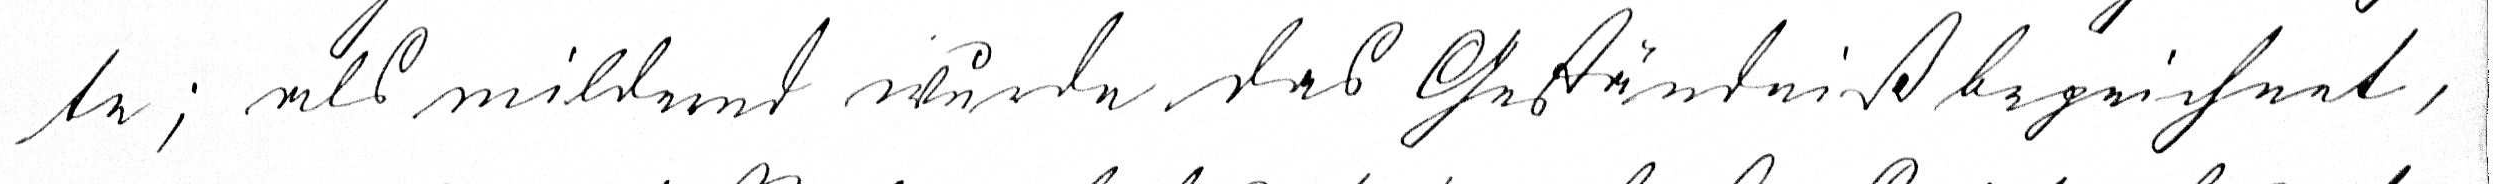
te; als mildernd wurde das Geständniß bezeichnet,
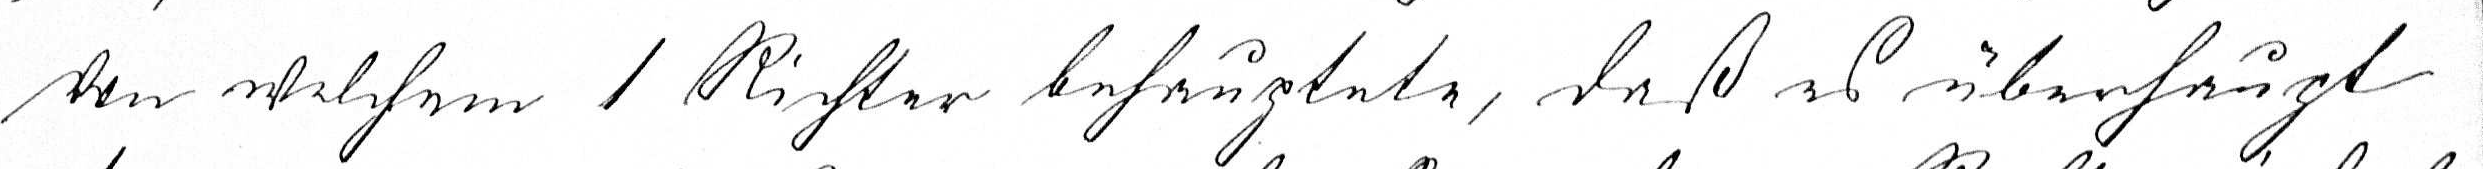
von welchem 1 Richter behauptete, daß es überhaupt
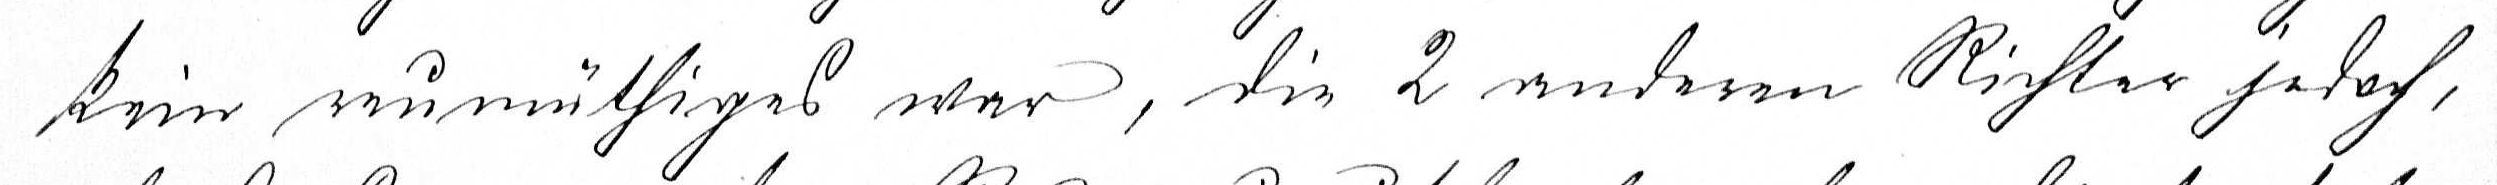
kein reumüthiges war, die 2 anderen Richter jedoch,
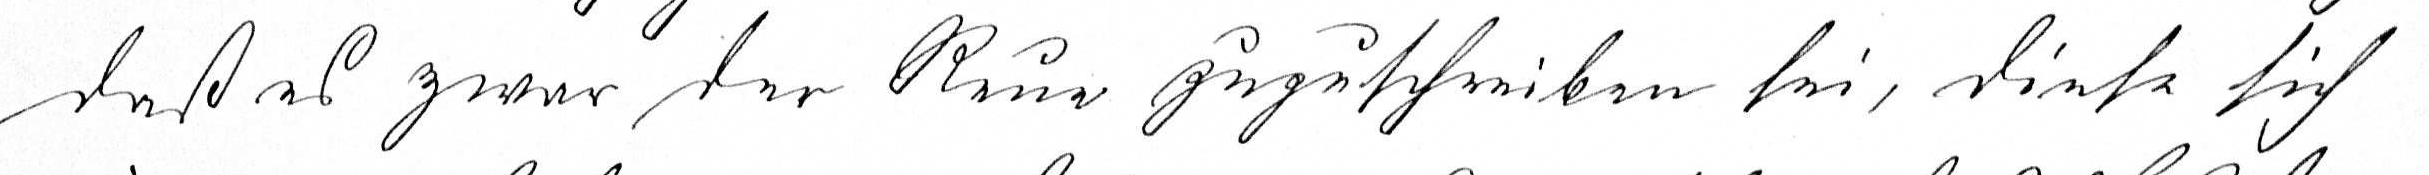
daß es zwar der Reue zuzuschreiben sei, diese sich
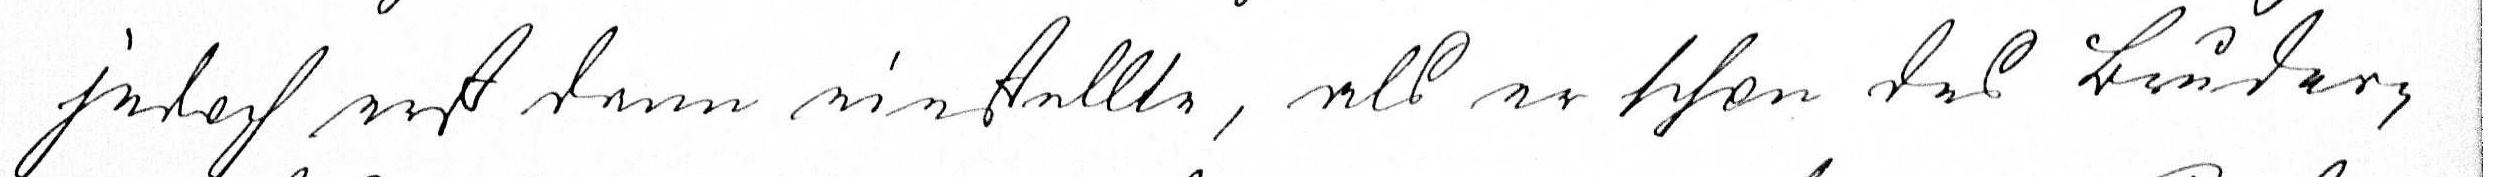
jedoch erst dann einstellte, als er schon des Bruder¬
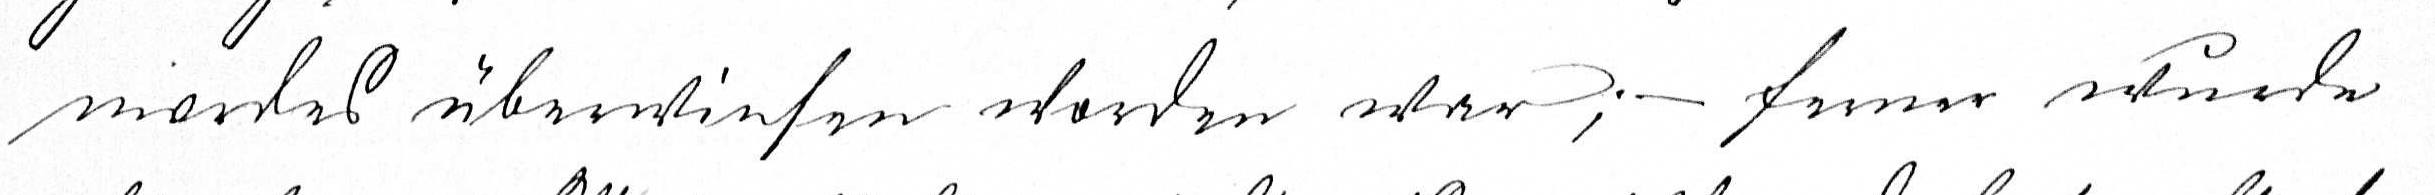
mordes überwiesen worden war;- ferner wurde
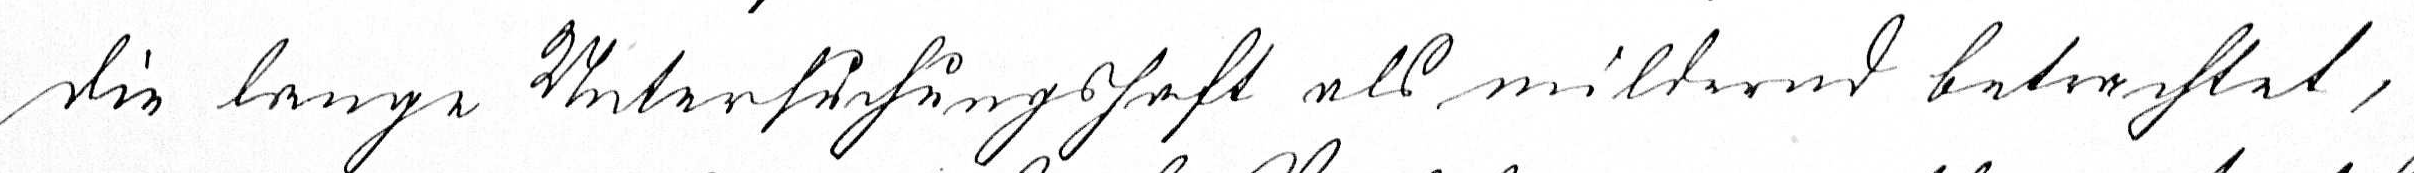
die lange Untersuchungshaft als mildernd betrachtet,
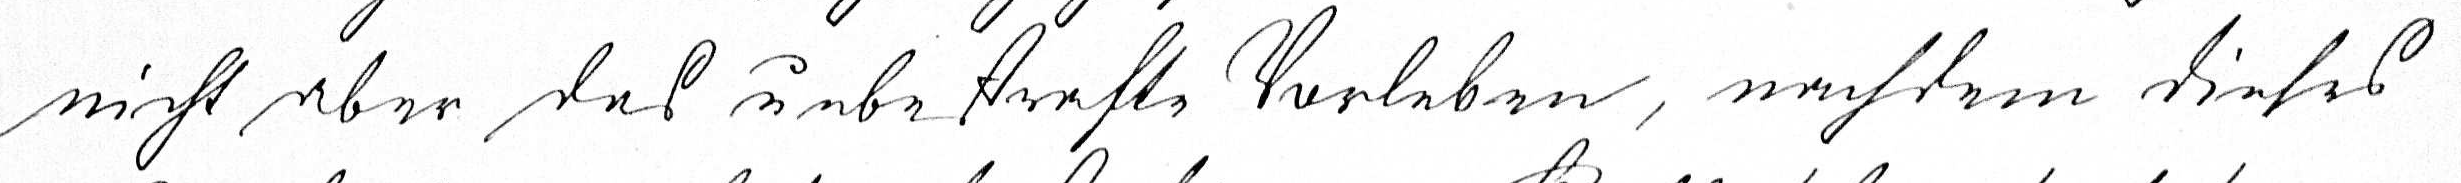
nicht aber das unbestrafte Vorleben, nachdem dieses
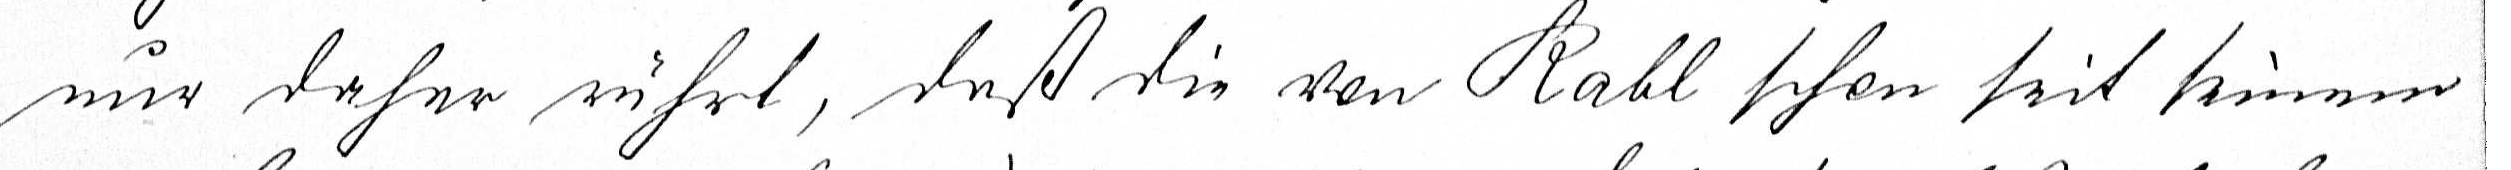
nur daher rührt, daß die von Rabl schon seit xx
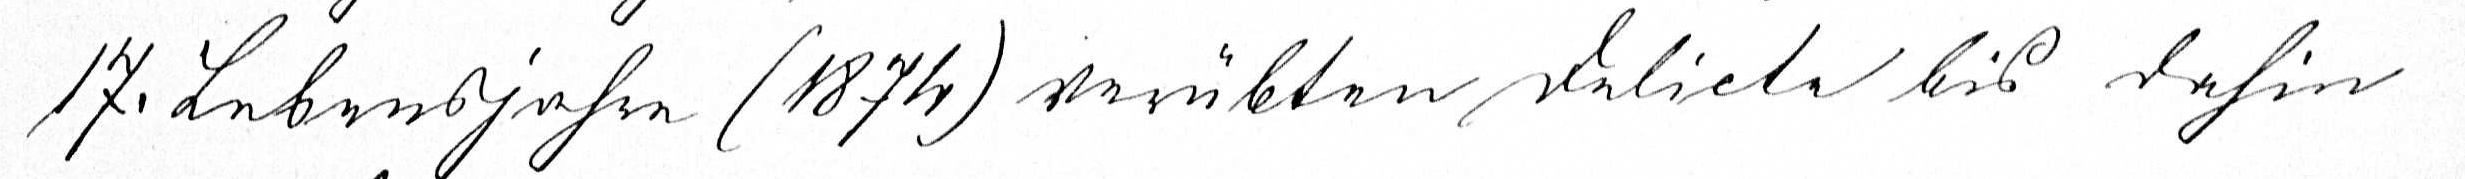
17. Lebensjahre (1874) verübten Delicte bis dahin
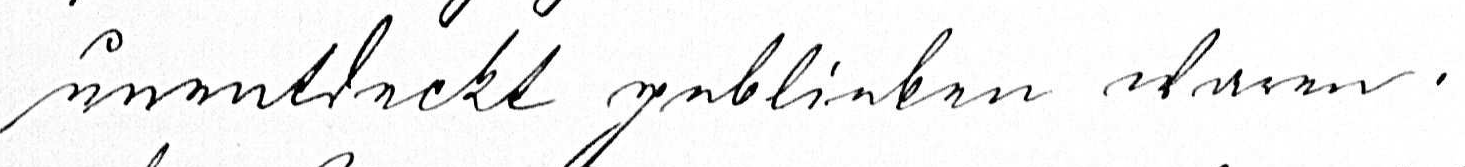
unentdeckt geblieben waren.
